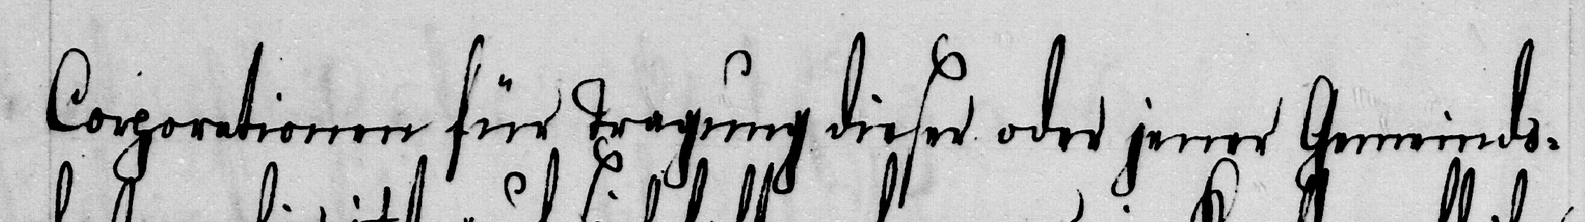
Corporationen für Tragung dieser oder jener Gemeinds¬
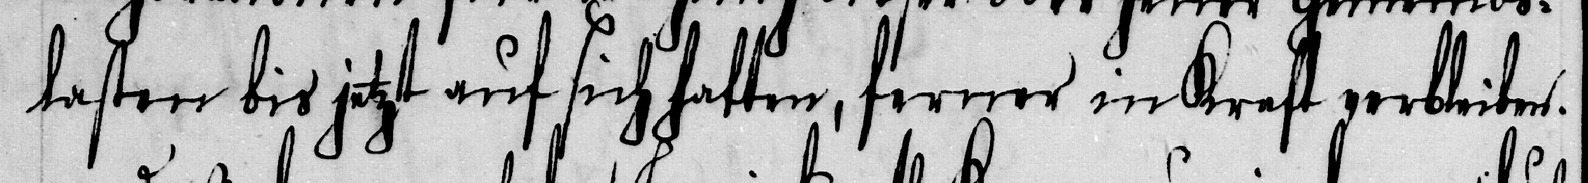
lasten bis jetzt auf sich hatten, ferner in Kraft verbleibe¬
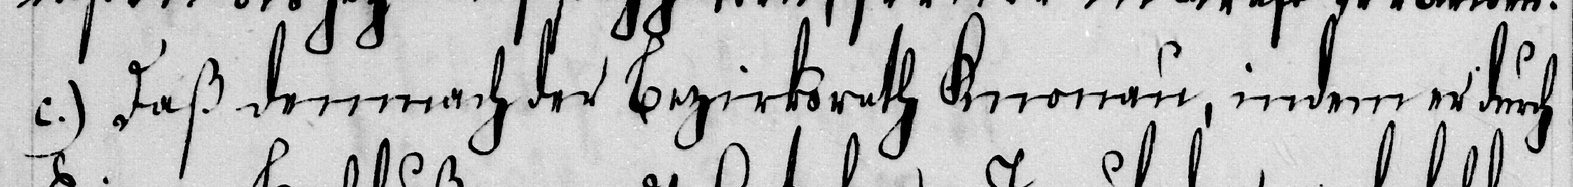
c.) Daß demnach der Bezirksrath Knonau, indem er durch
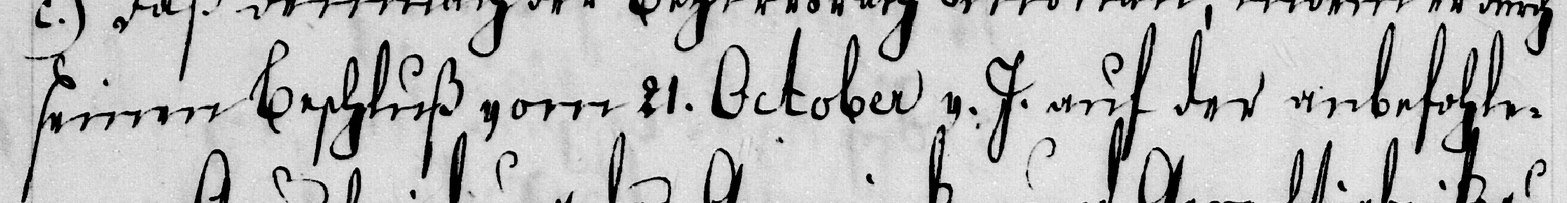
seinen Beschluß vom 21. October v. J. auf der anbefohle¬
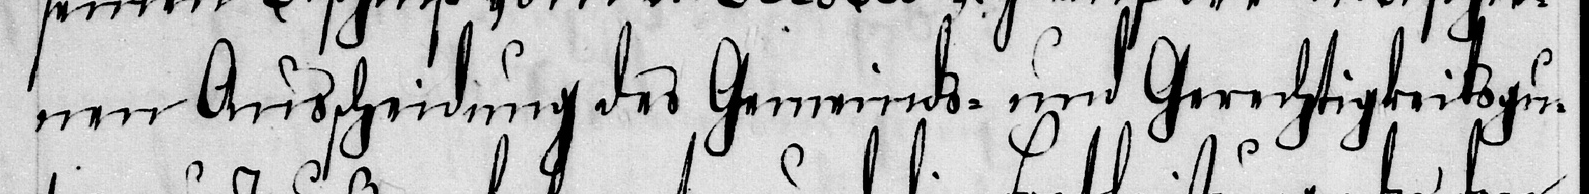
nen Ausscheidung des Gemeinds- und Gerechtigkeitsgu¬
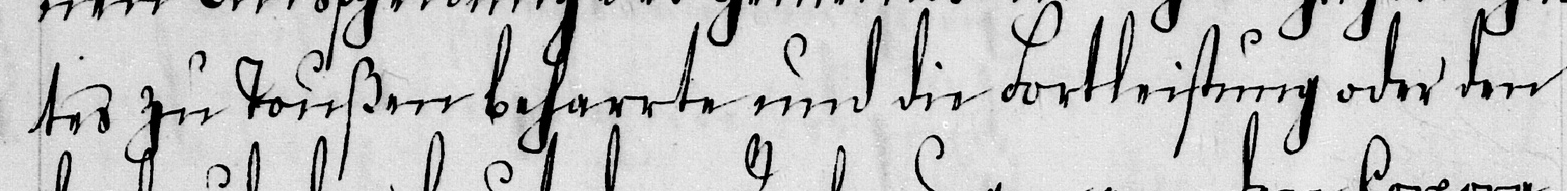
tes zu Toußen beharrte und die Fortleistung oder den
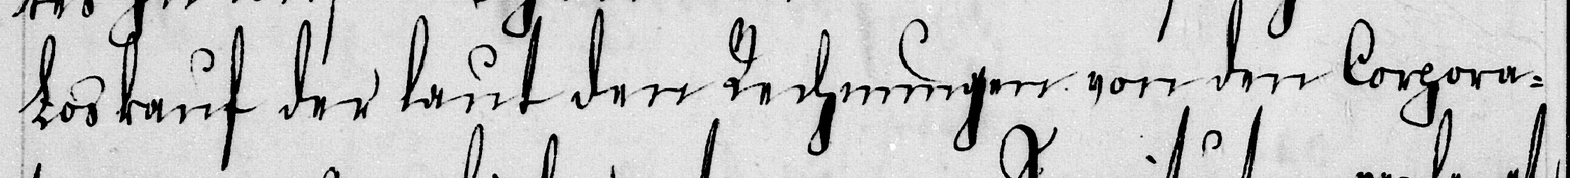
Loskauf der laut den Rechnungen von den Corpora¬
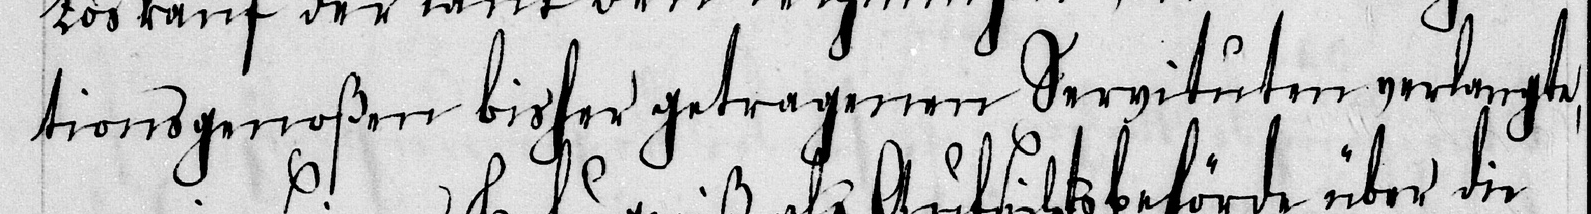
tionsgenoßen bisher getragenen Servituten verlangte,
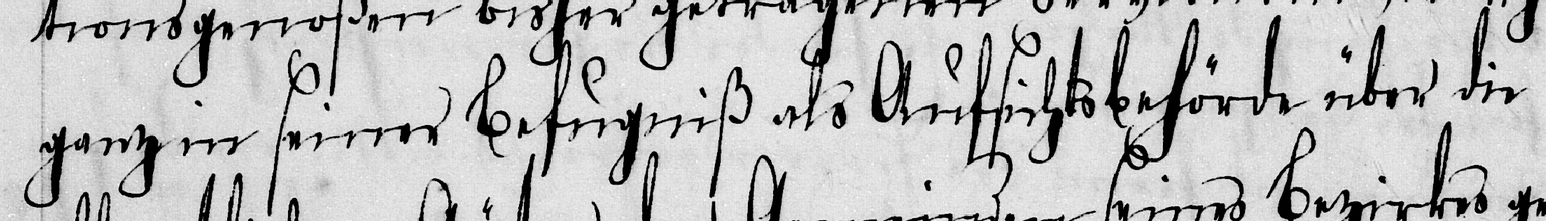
ganz in seiner Befugniß als Aufsichtsbehörde über die
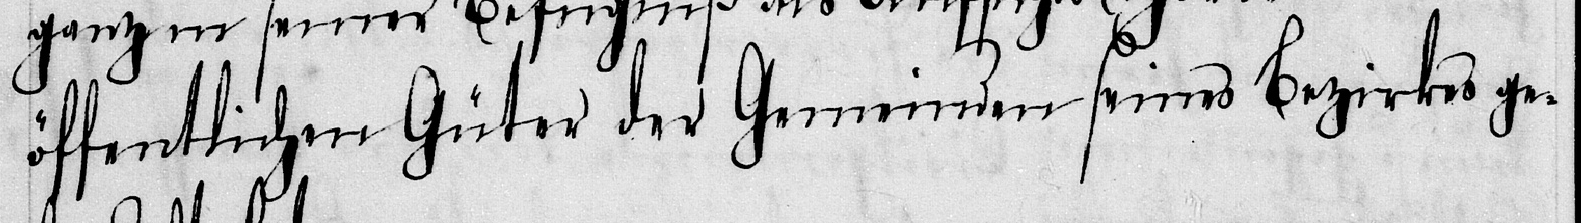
öffentlichen Güter der Gemeinden seines Bezirkes ge¬
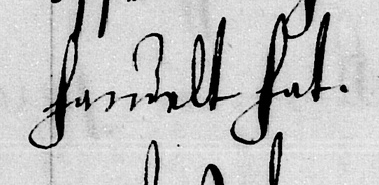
handelt hat.
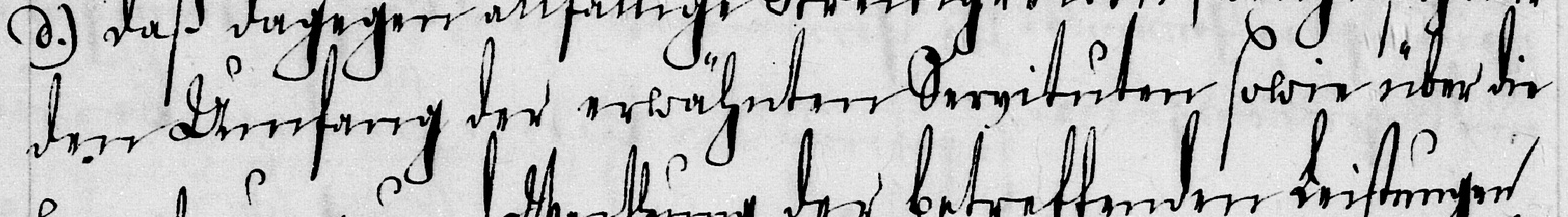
den Umfang der erwähnten Servituten sowie über die
